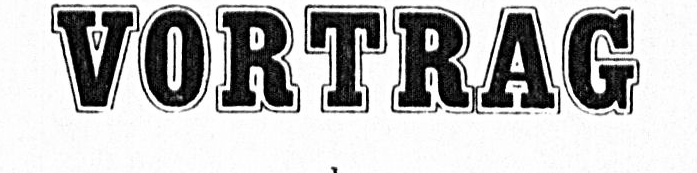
VORTRAG
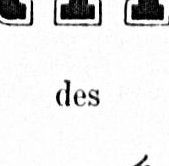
des
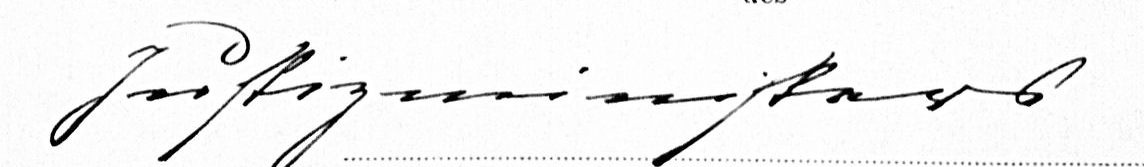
Justizministers
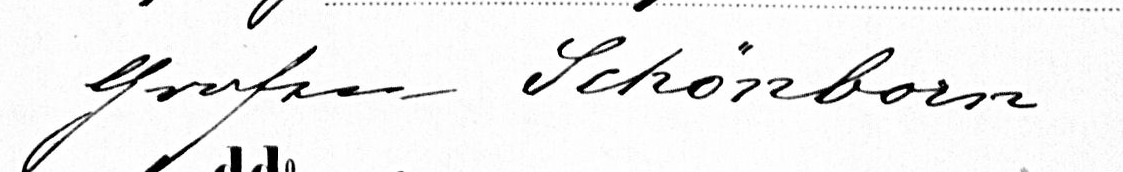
Grafen Schöborn
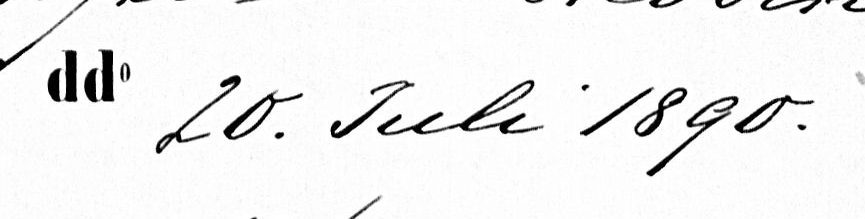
dd° 20. Juli 1890.
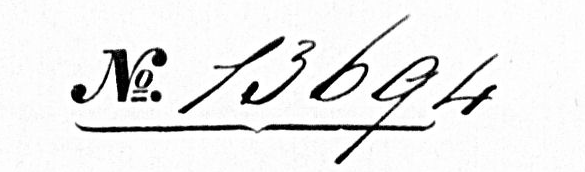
N° 13694
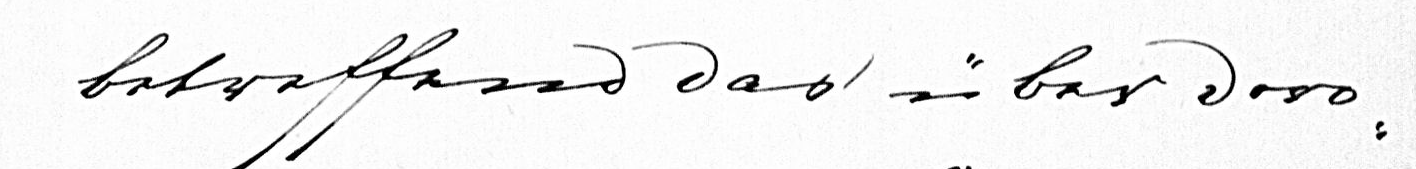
betreffend das über Doro¬
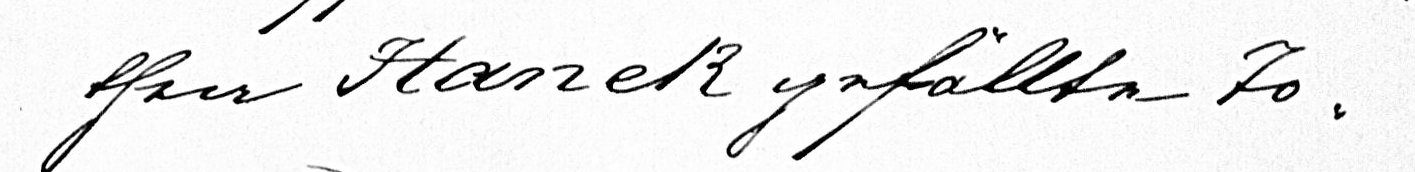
thea Hanek gefällte To¬
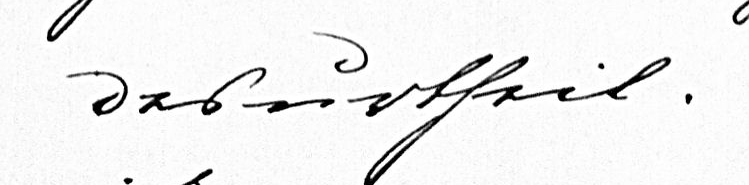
desurtheil.
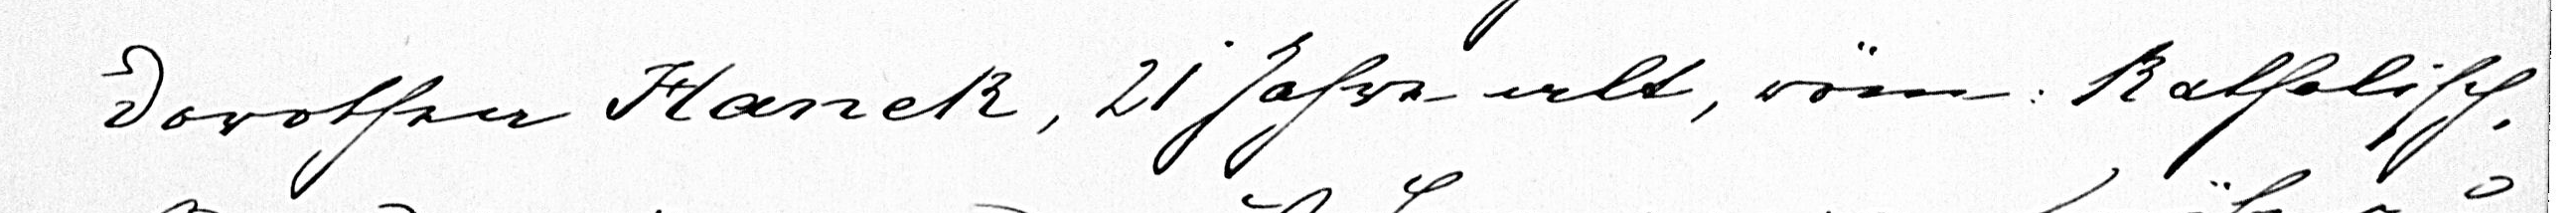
Dorothea Hanek, 21 Jahre alt, röm. katholisch,
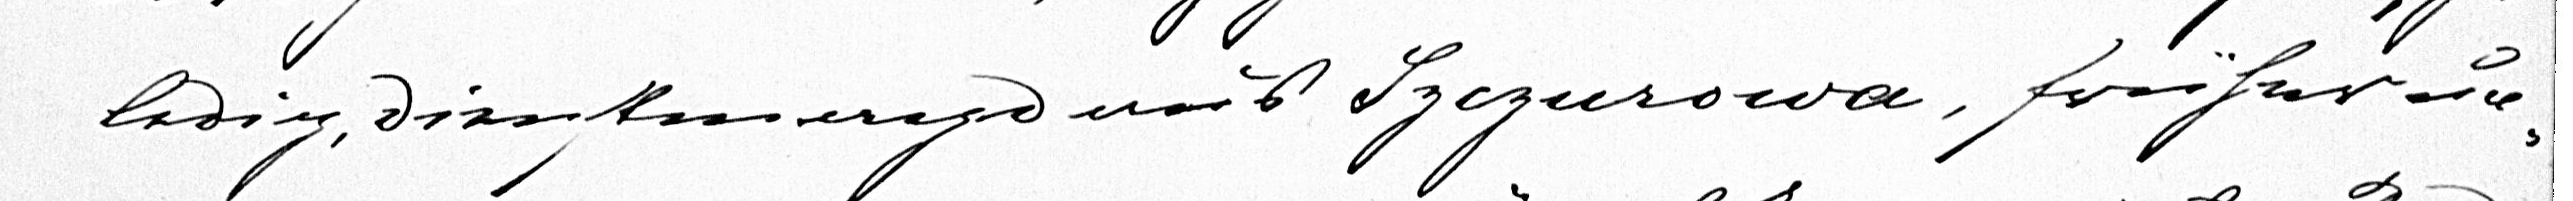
ledig, Dienstmagd aus Szczurowa, früher un¬
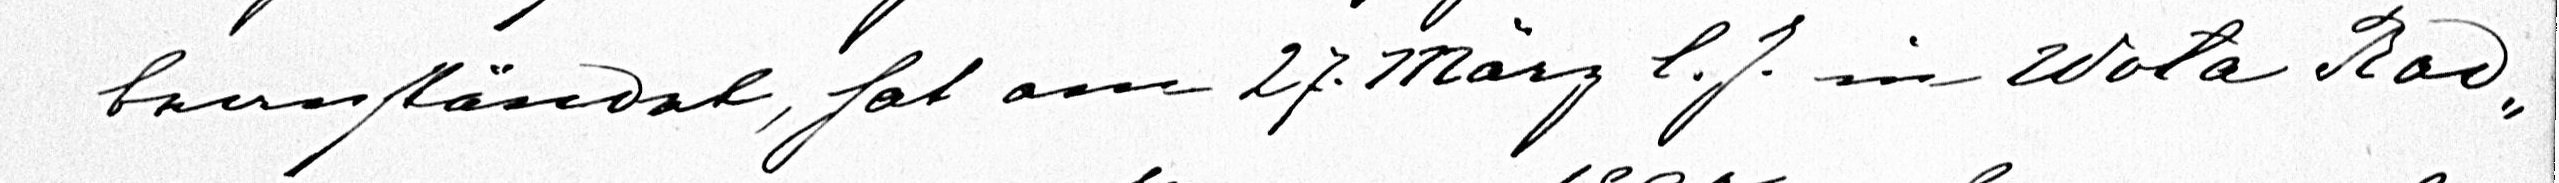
beanständet, hat am 27. März l.J. in Woła Rod¬
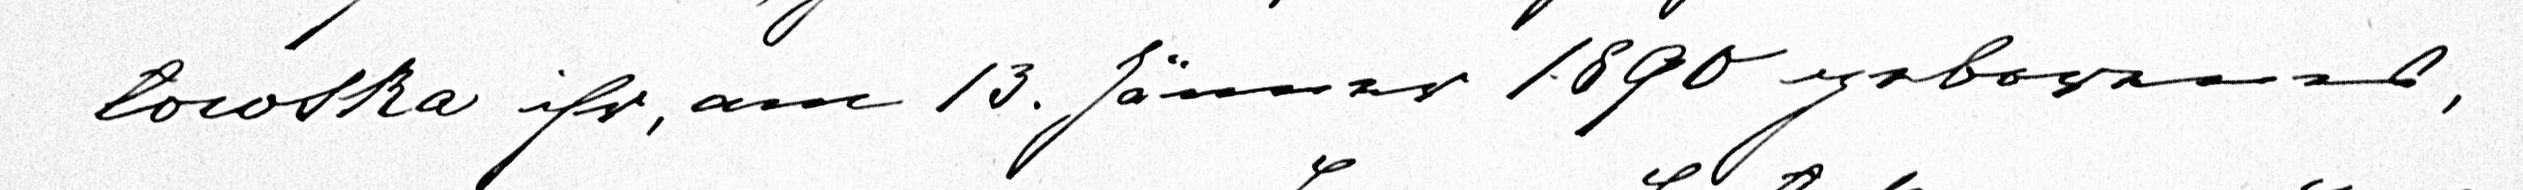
łowska ihr, am 13. Jänner 1890 geborenes,
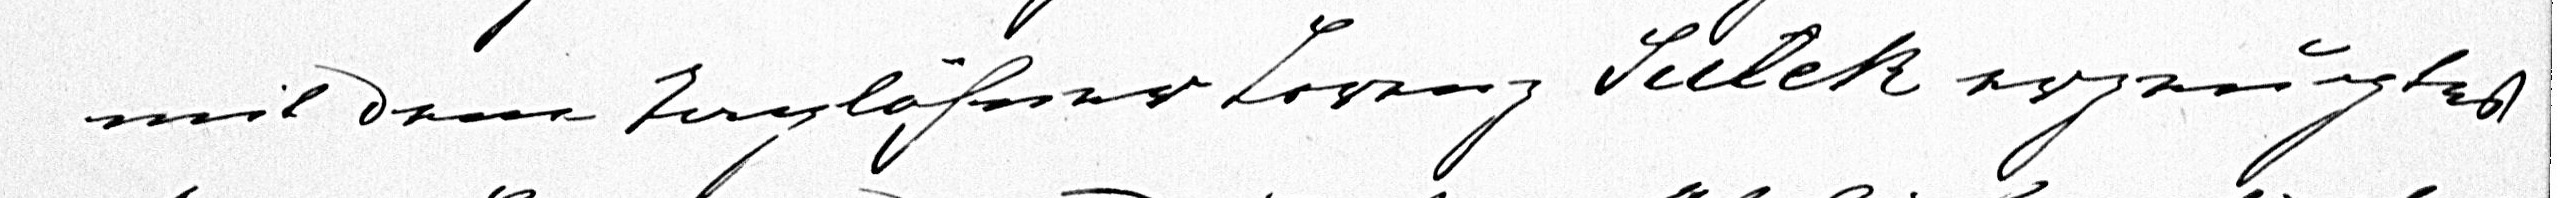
mit dem Taglöhner Lorenz Sułek erzeugtes
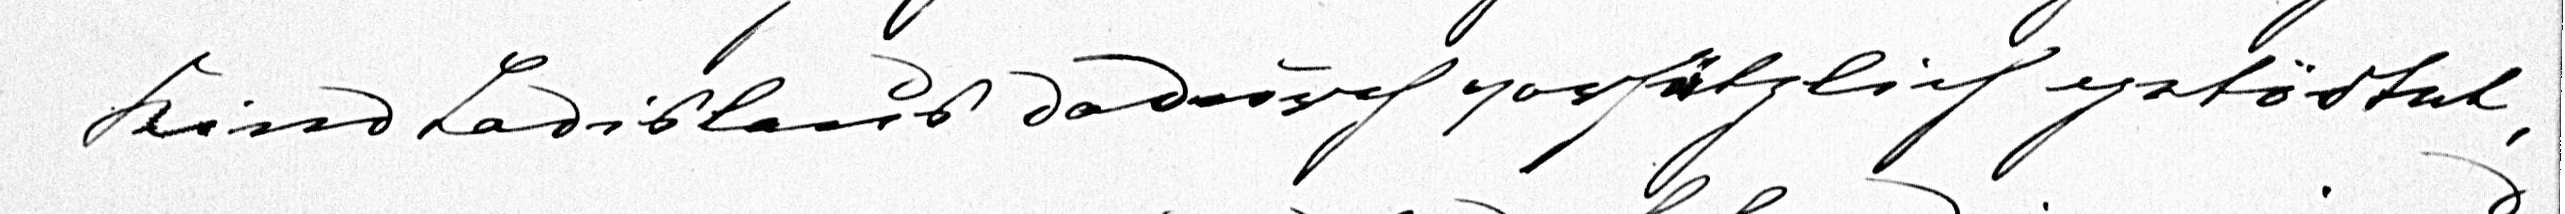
Kind Ladislaus dadurch vorsätzlich getödtet,
